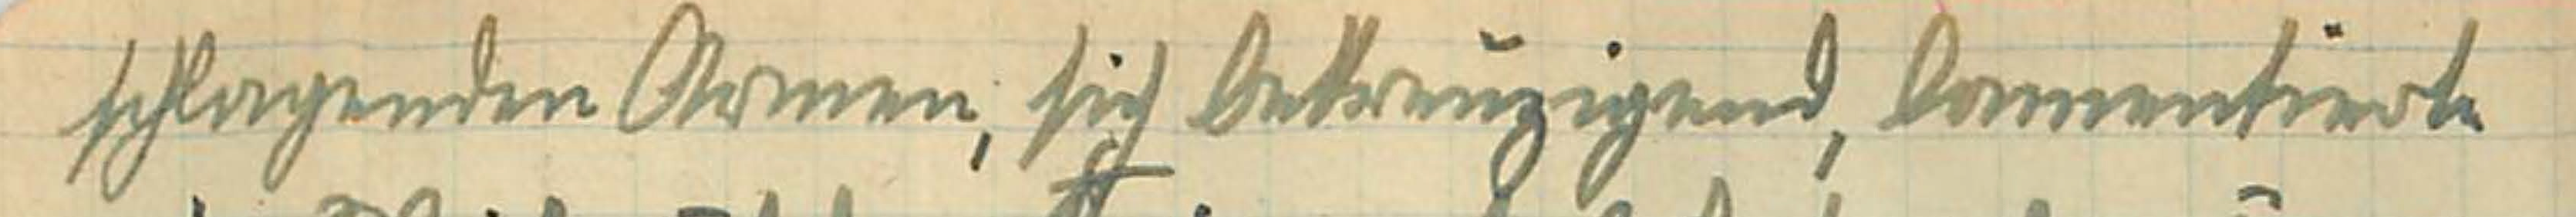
schlagenden Armen, sich bekreuzigend, lamentierte
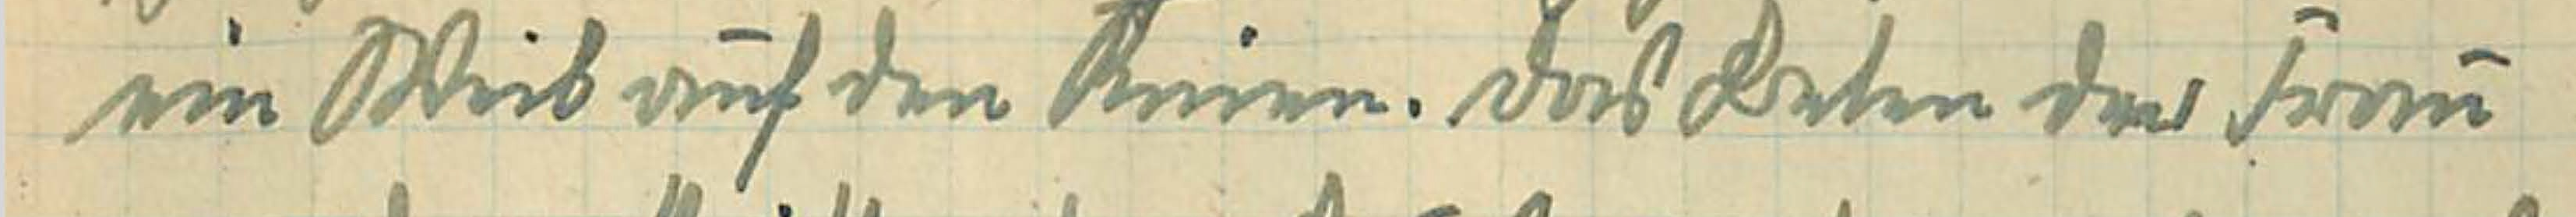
ein Weib auf den Knien. Das Beten der Frau
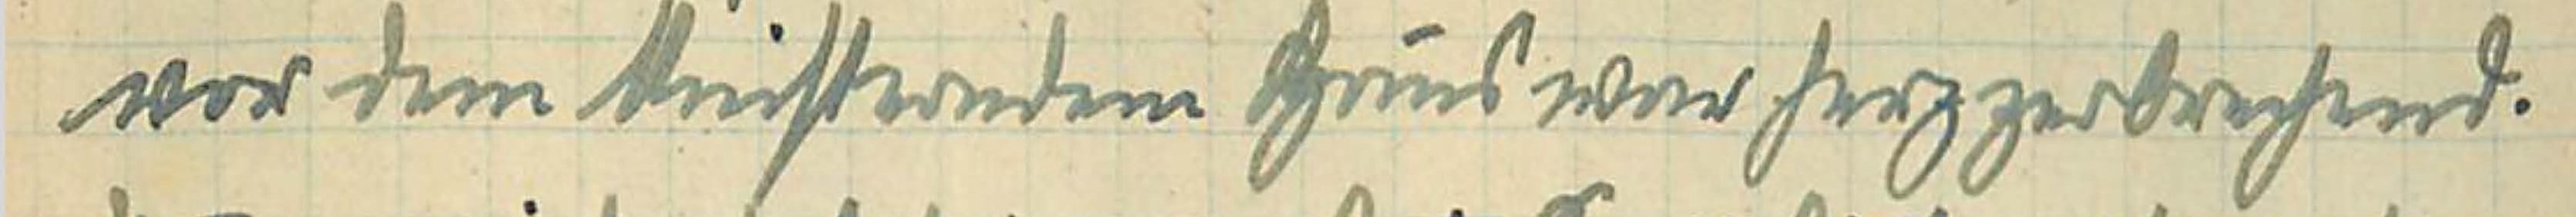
vor dem knisterndem Haus war herzzerbrechend.
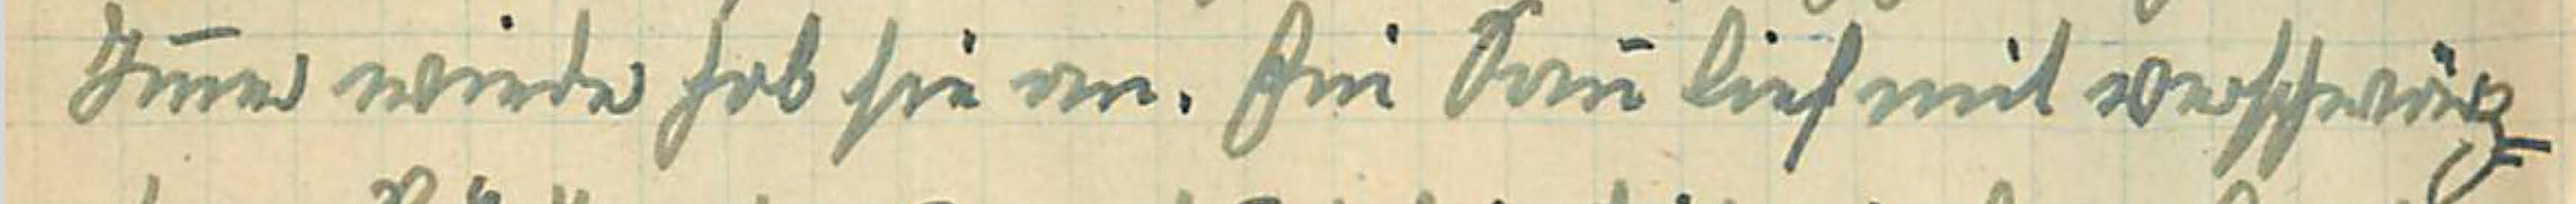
Immer wieder hob sie an. Eine Sau lief mit verschwärz-
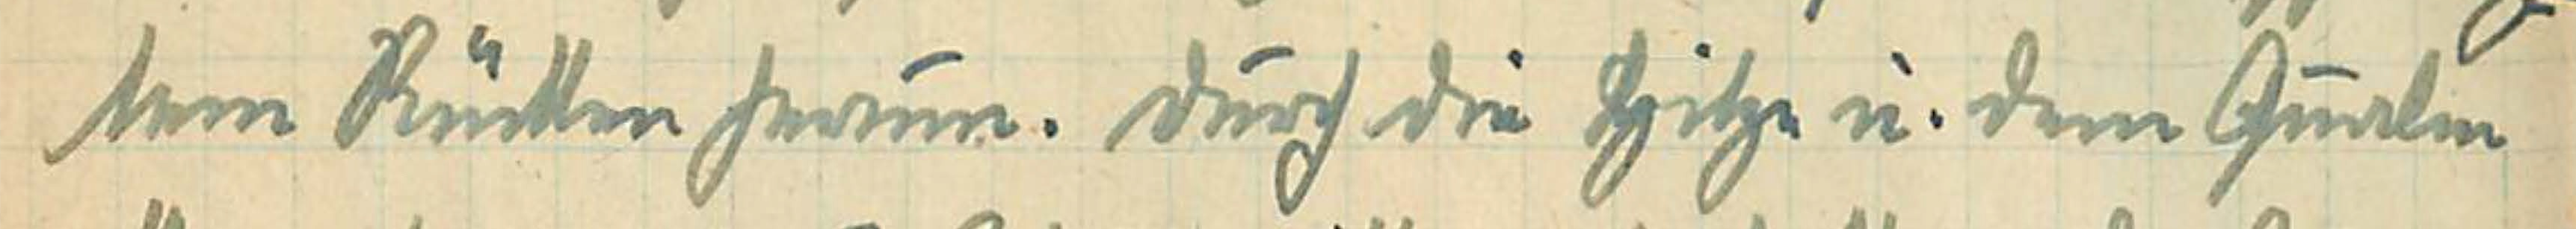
tem Rücken herum. Durch die Hitze und dem Qualm
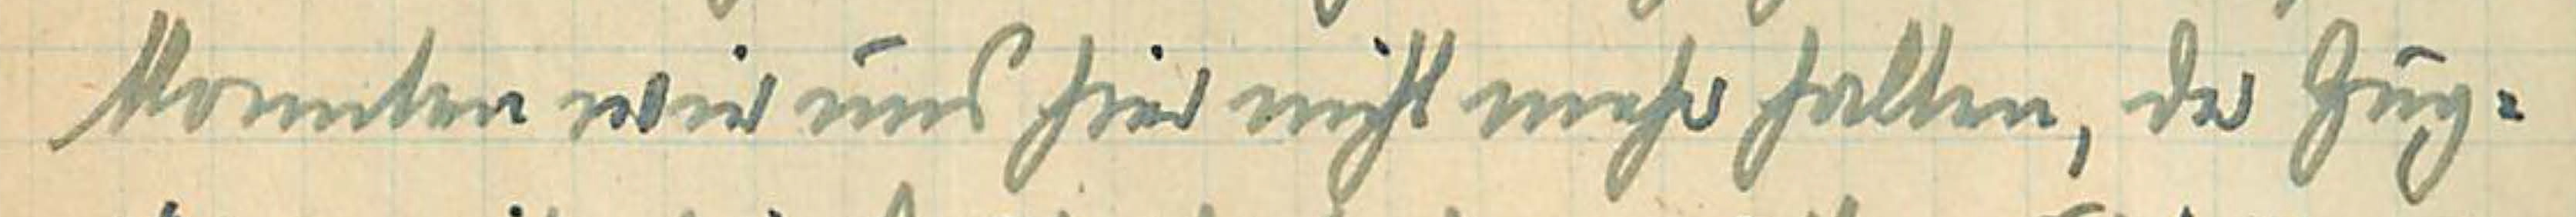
konnten wir uns hier nicht mehr halten, der Zug-
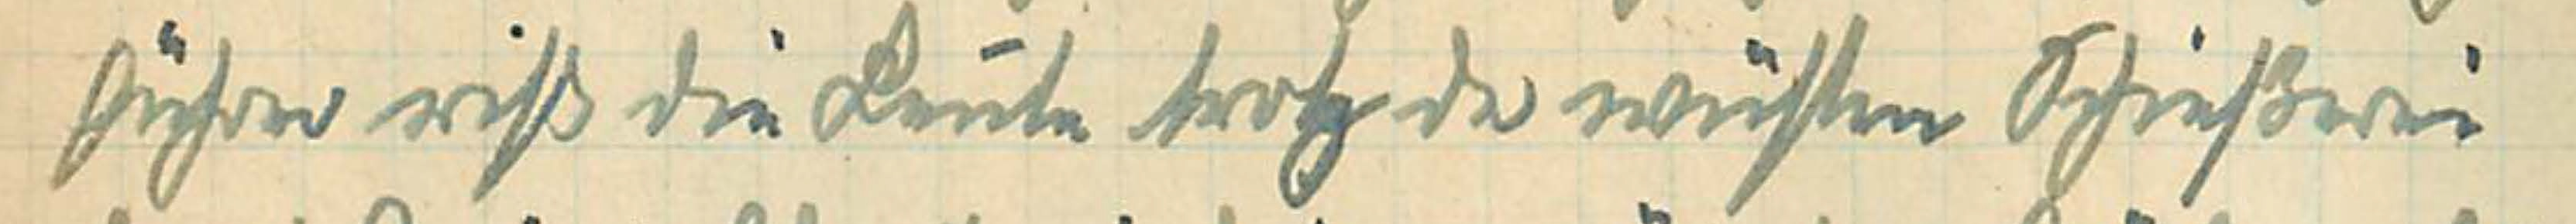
führer riß die Leute trotz der wüsten Schießerei
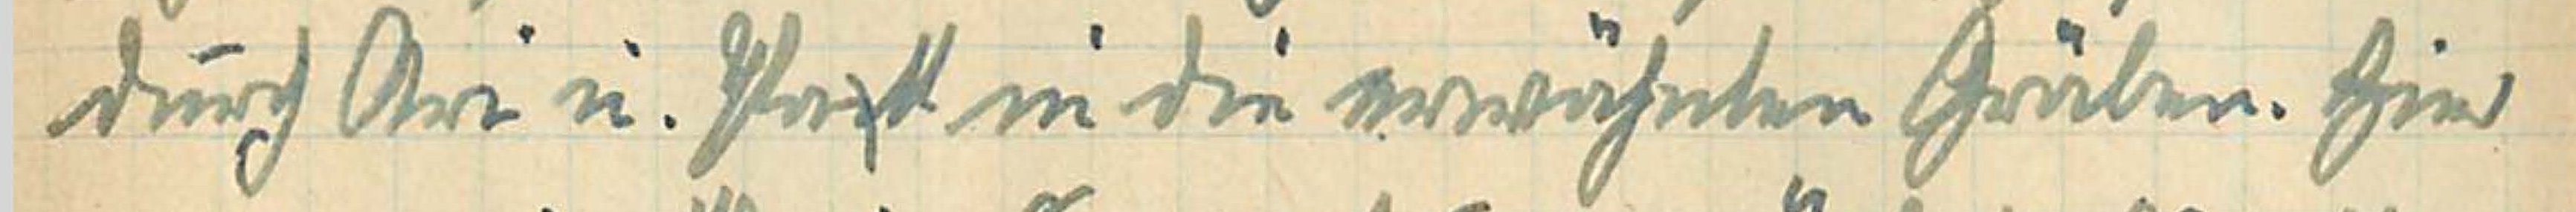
durch Ari u. Pack in die erwähnten Gräben. Hier
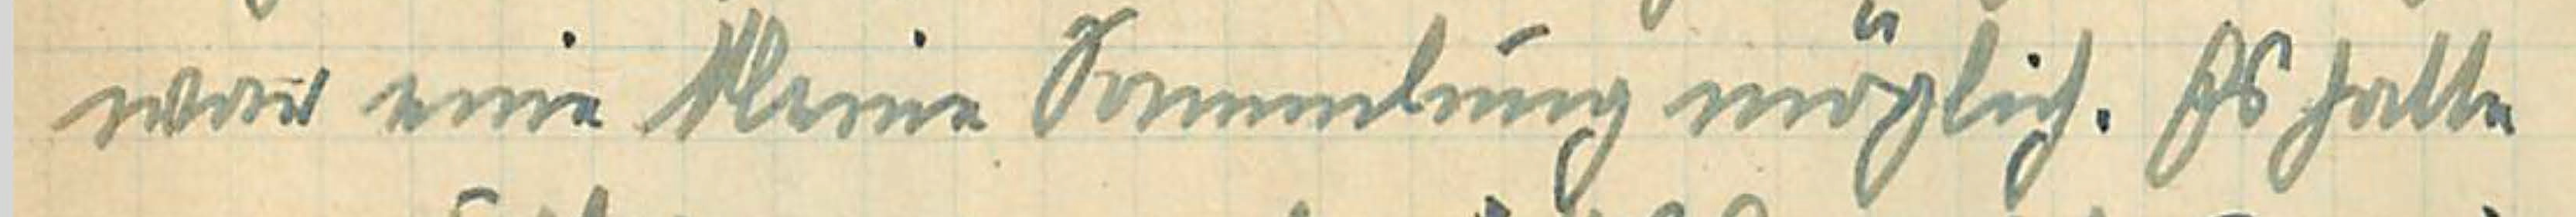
war eine kleine Sammlung möglich. Es hatte
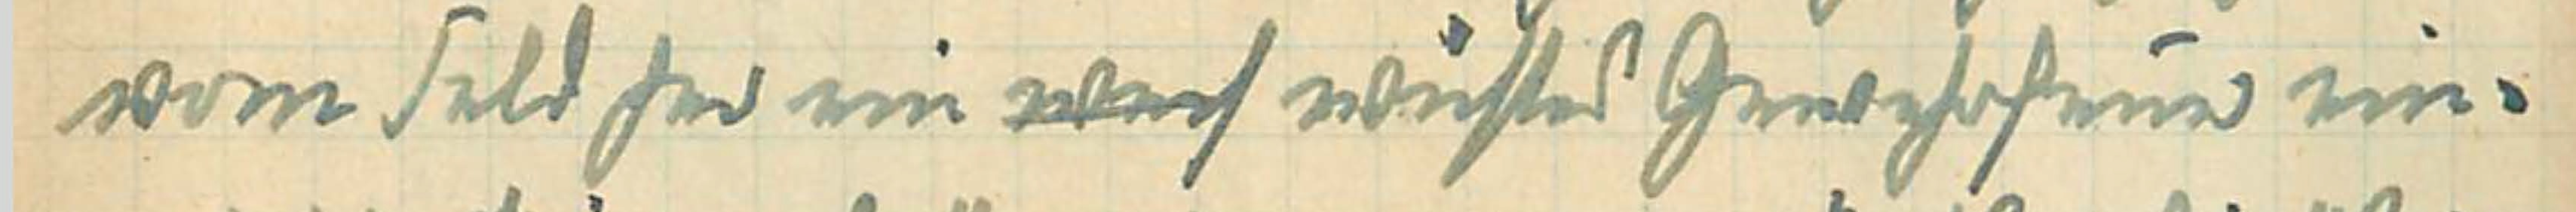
vom Feld her ein wech wüstes Gewehrfeuer ein-
